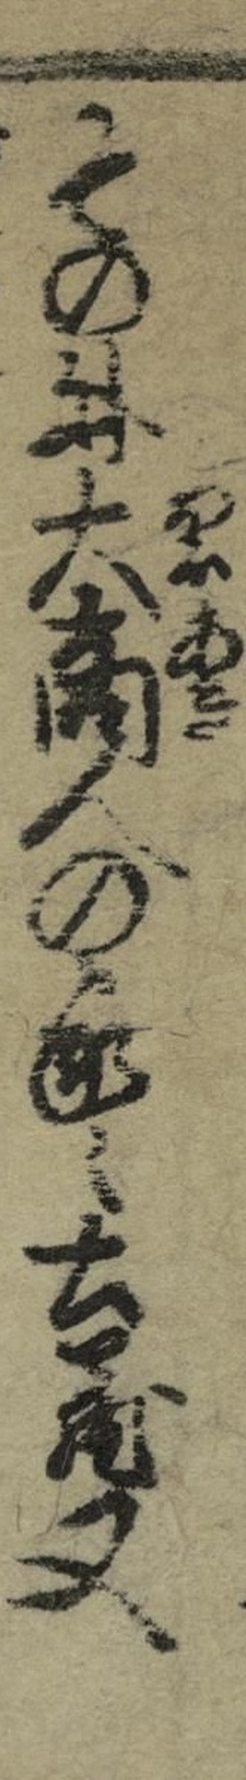その外大商人の家々土蔵又
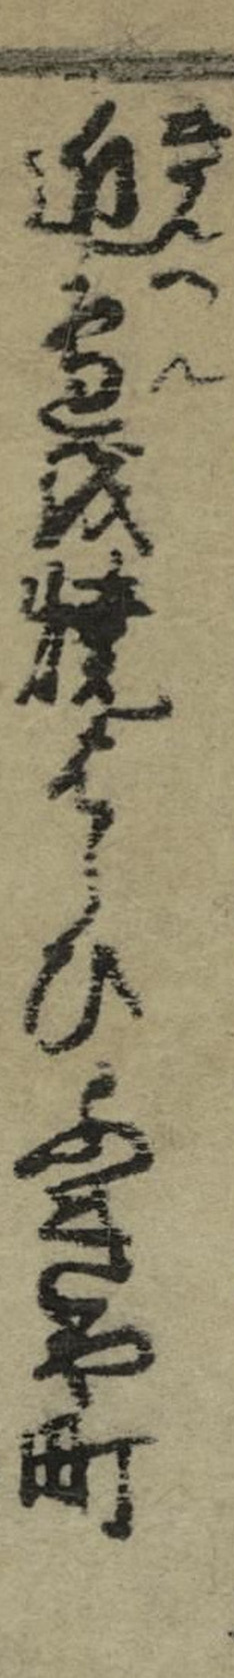近辺を焼はらひふきや町
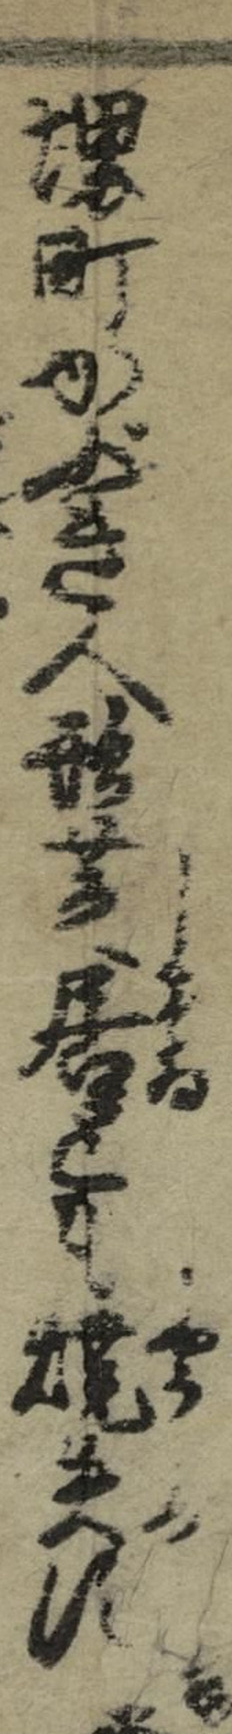堺町かぶき人形芝居とも焼失ひ
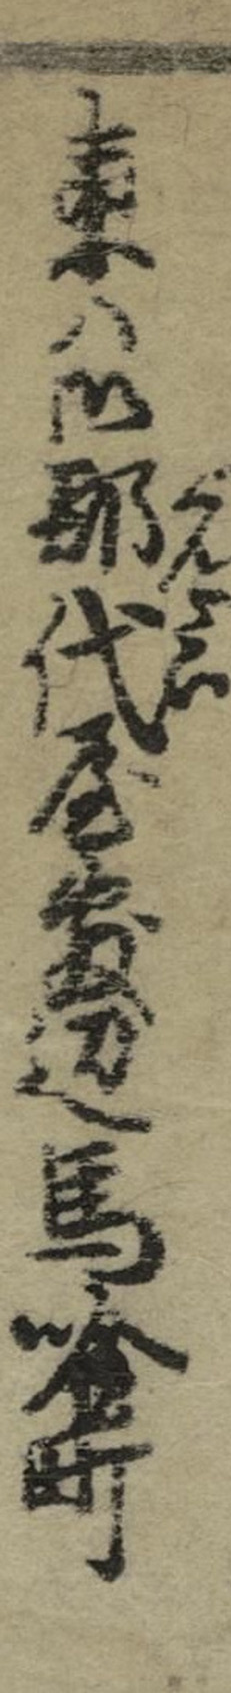東ハ御郡代屋敷辺馬喰町
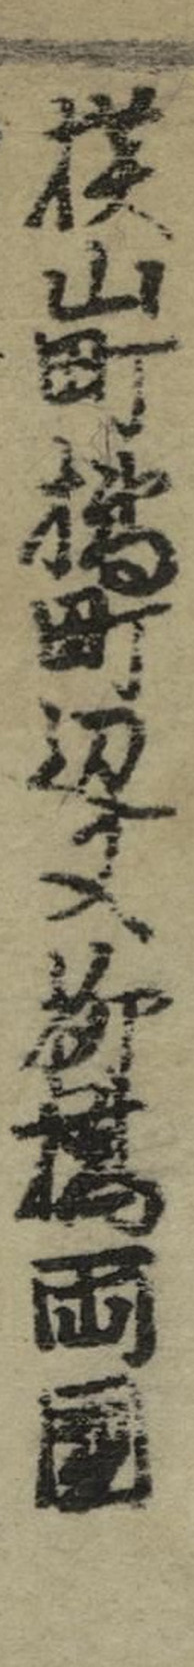横山町橋町辺又柳橋両国
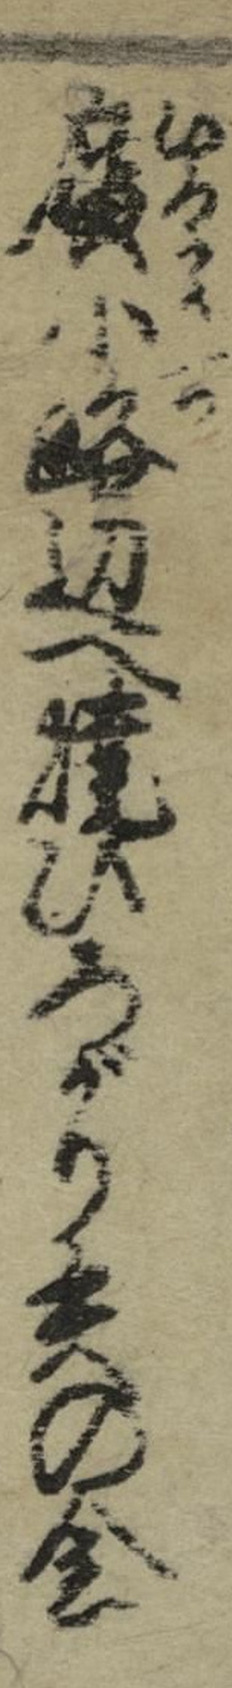広小路辺へ焼ひろがり夫の金
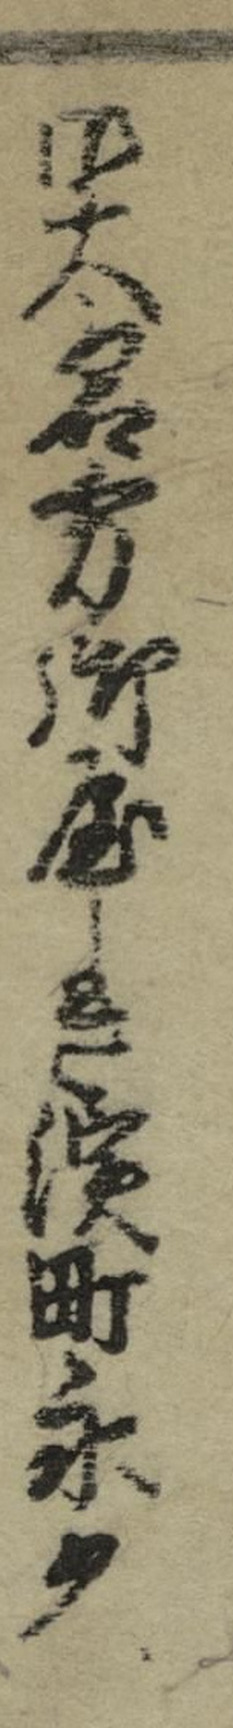御大名方御やしき浜町永久
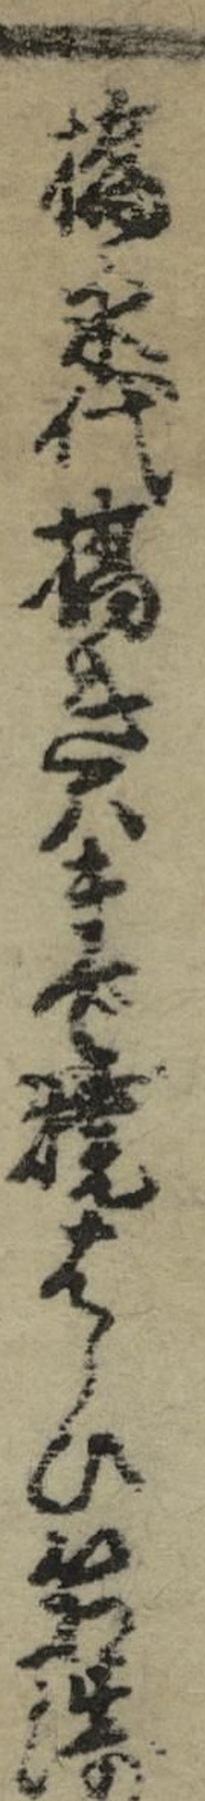橋永代橋きハまで焼はらひ箱崎
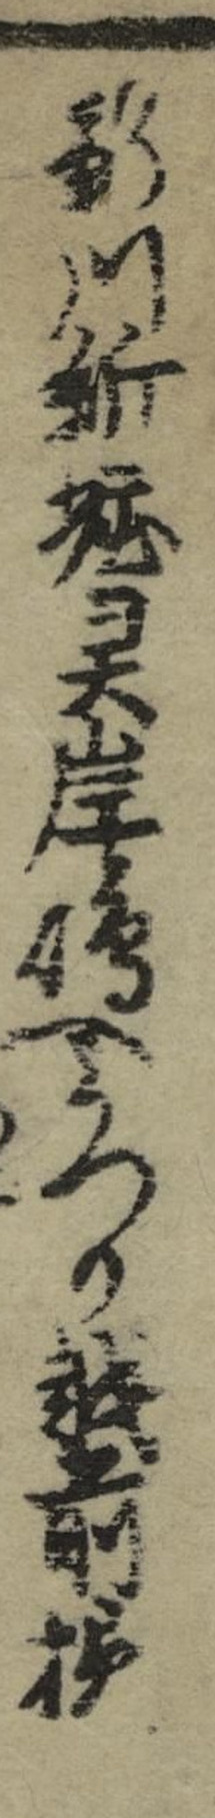新川新堀霊岸嶋へうつり越前様
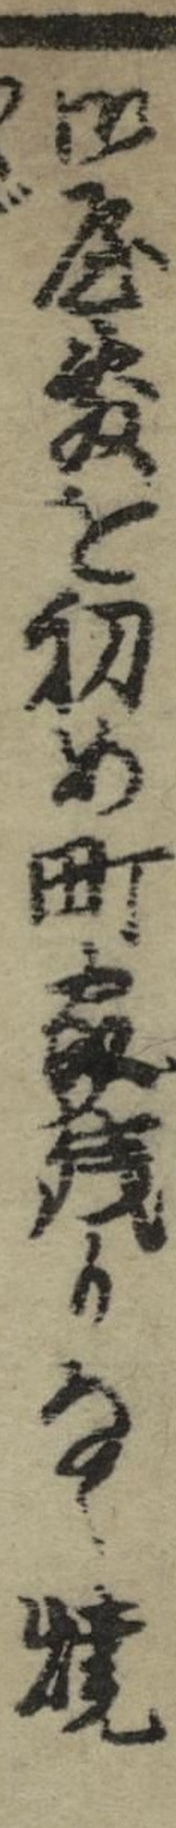御屋敷を初め町家残りなく焼
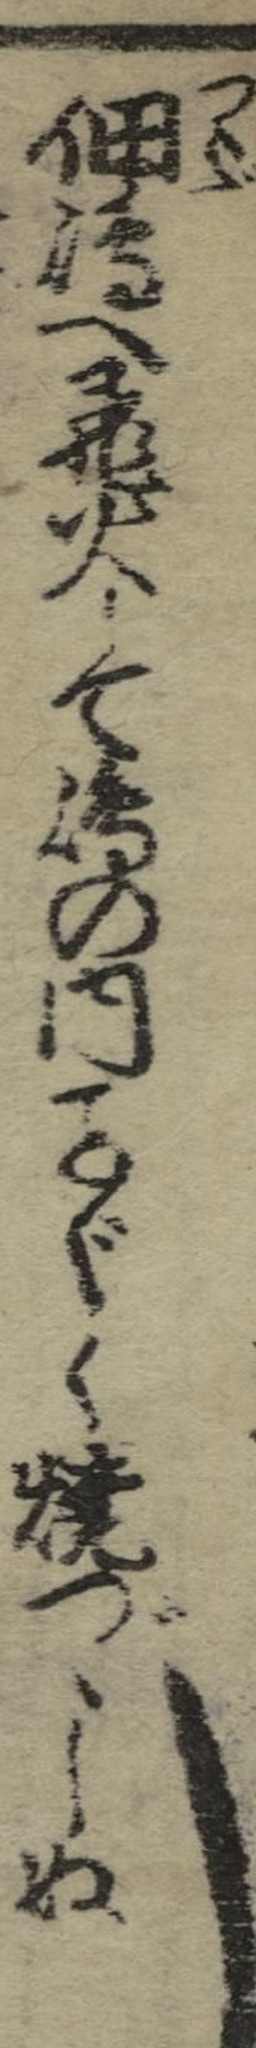佃嶋へ飛火して嶋の内こと〴〵く焼づくしぬ
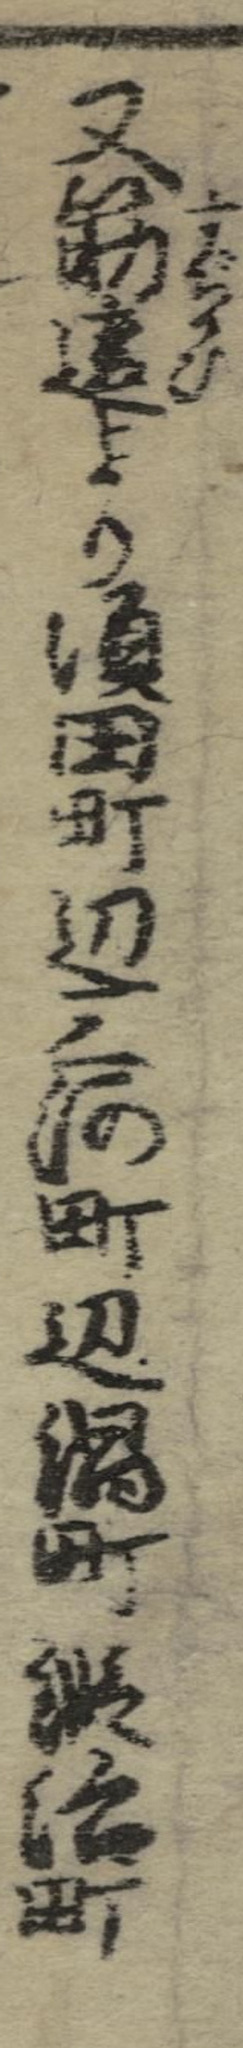又筋違より須田町辺三河町辺鍋町鍛冶町
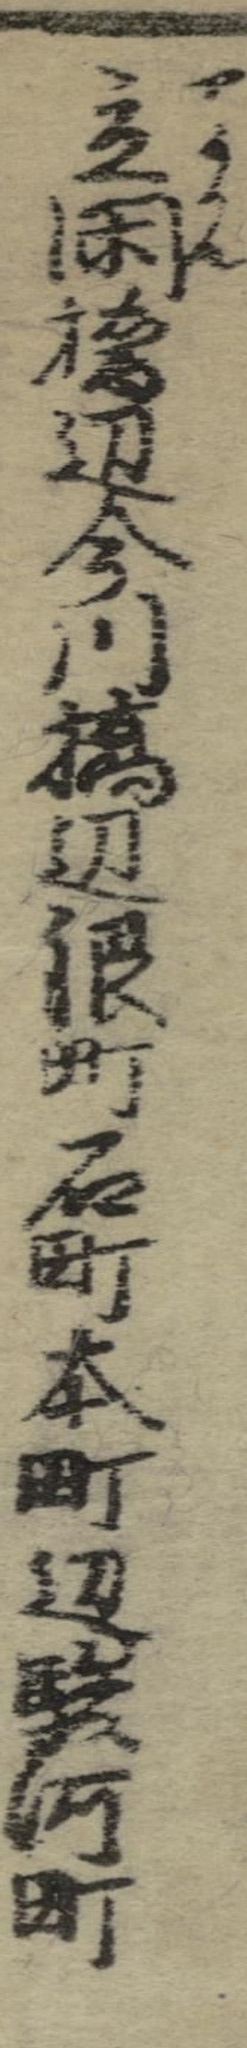立閑橋辺今川橋辺銀町石町本町辺駿河町
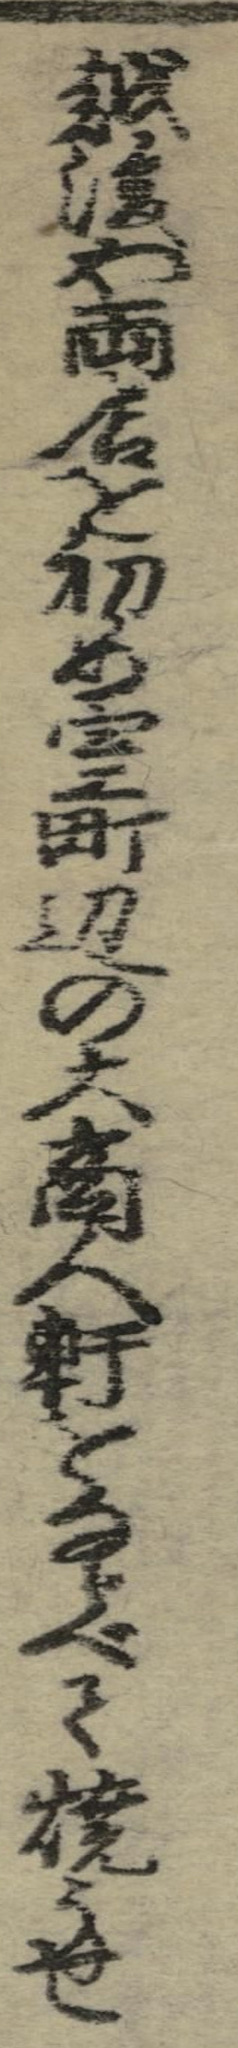越後や両店を初め室町辺大商人軒をならべて焼うせ
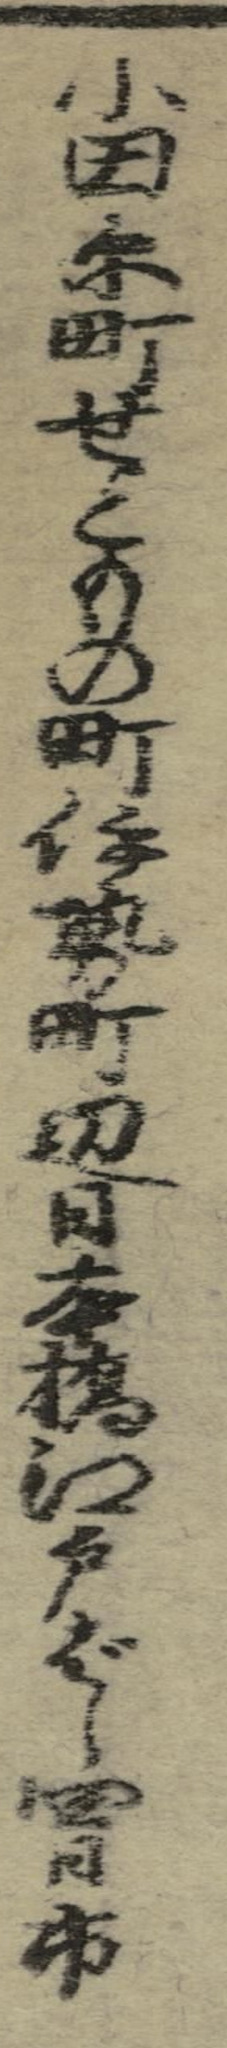小田原町せともの町伊勢町辺日本橋土ばし四日市
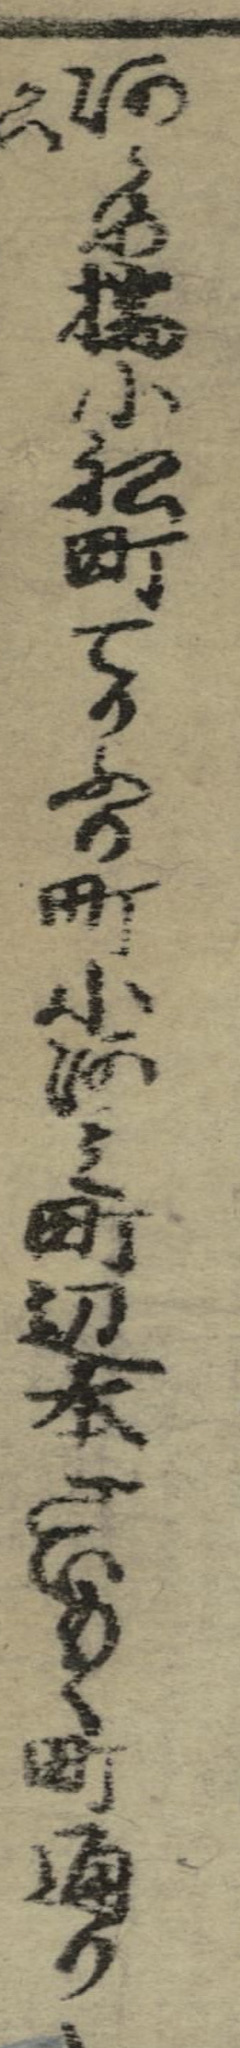河原橋小松町てりふり町小あミ町辺本ざいもく町通り
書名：[文政十二年三月の江戸大火に関する瓦版]
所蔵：東京大学地震研究所図書室 Earthquake Research Institute Library, The University of Tokyo, JAPAN
